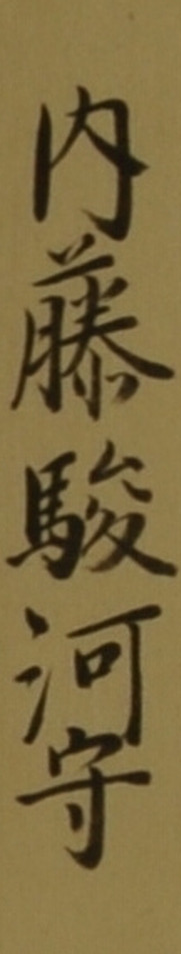内藤駿河守
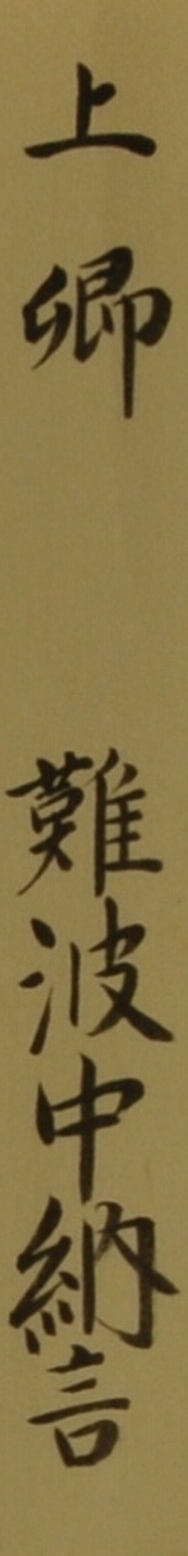上卿難波中納言
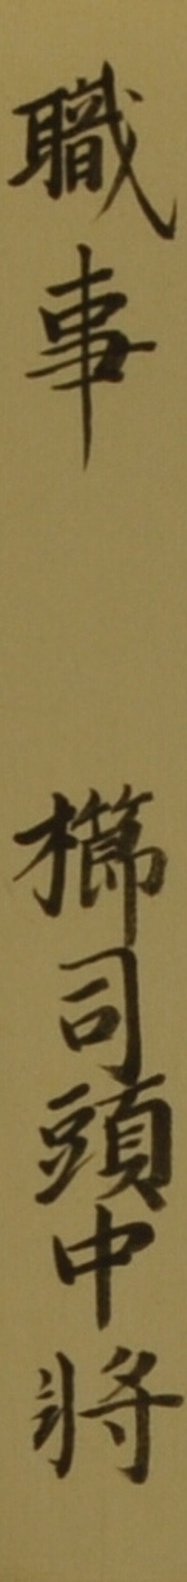職事櫛司頭中将
